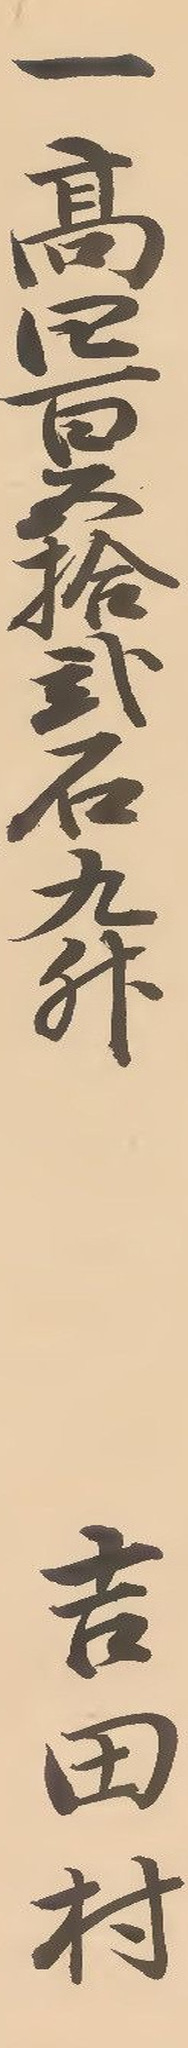一高四百五拾弐石九升吉田村
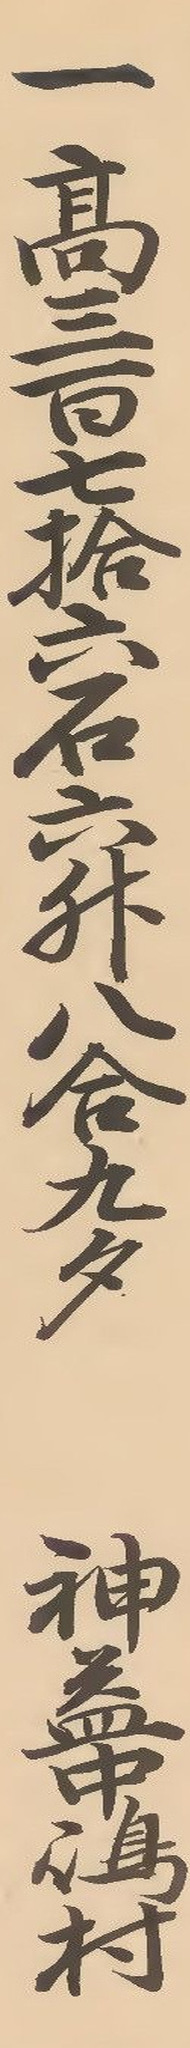一高三百七拾六石六升八合九勺神益中島村
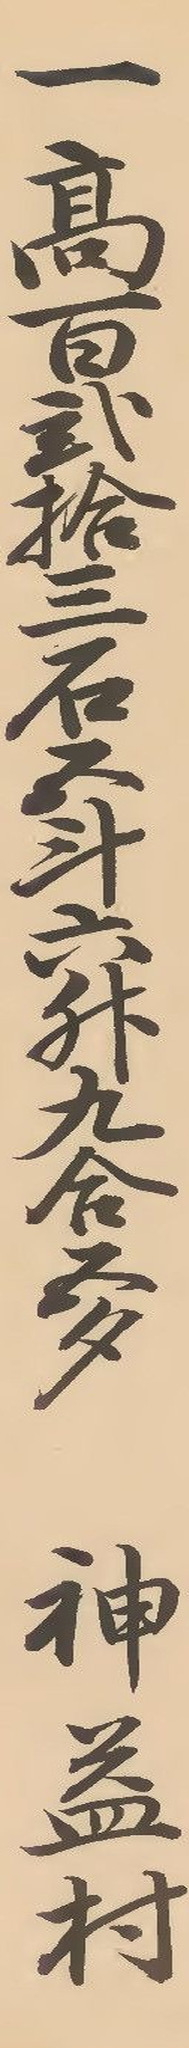一高百弐拾三石五斗六升九合五勺神益村
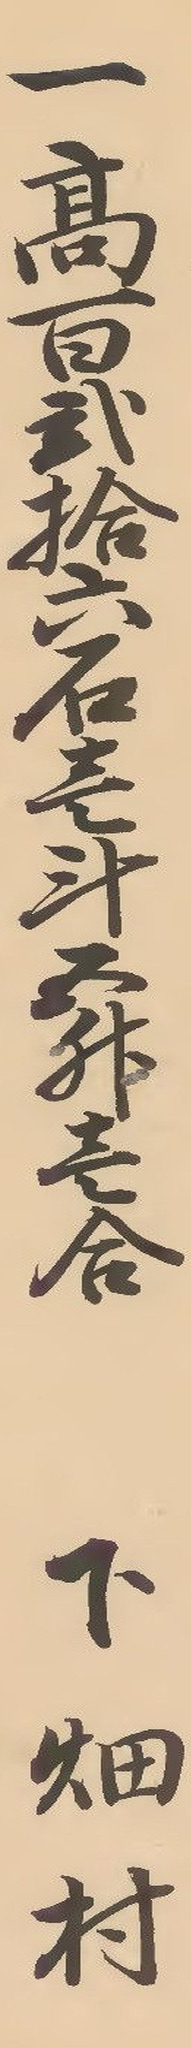一高百弐拾六石壱斗五升壱合下畑村

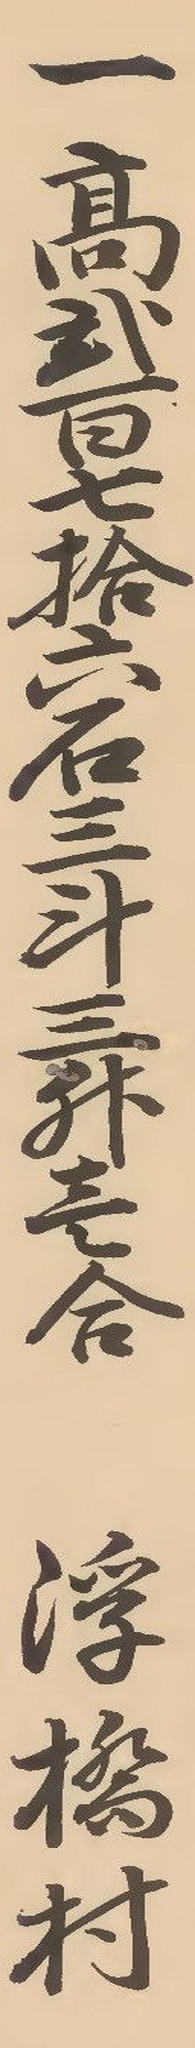一高弐百七拾六石三斗三升壱合浮橋村
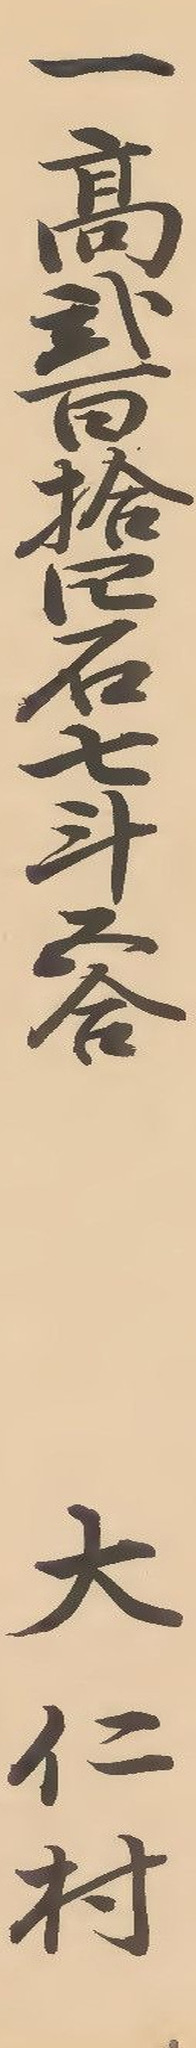一高弐百拾四石七斗五合大仁村
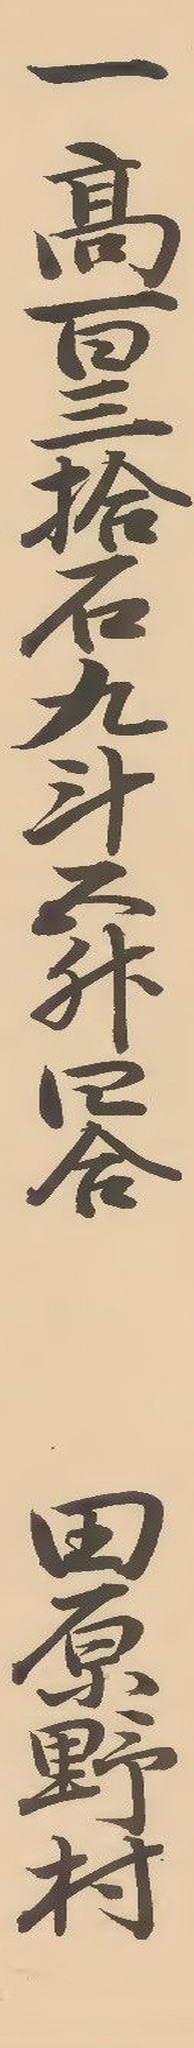一高百三拾石九斗五升四合田原野村
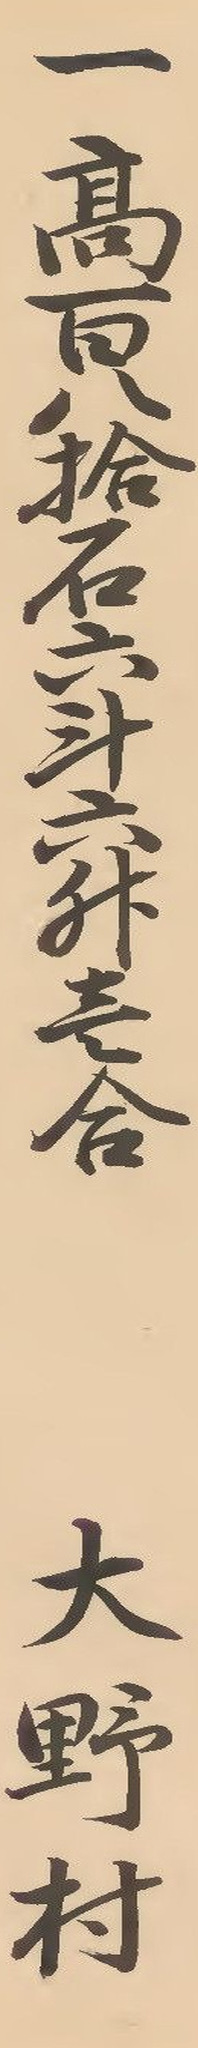一高百八拾石六斗六升壱合大野村
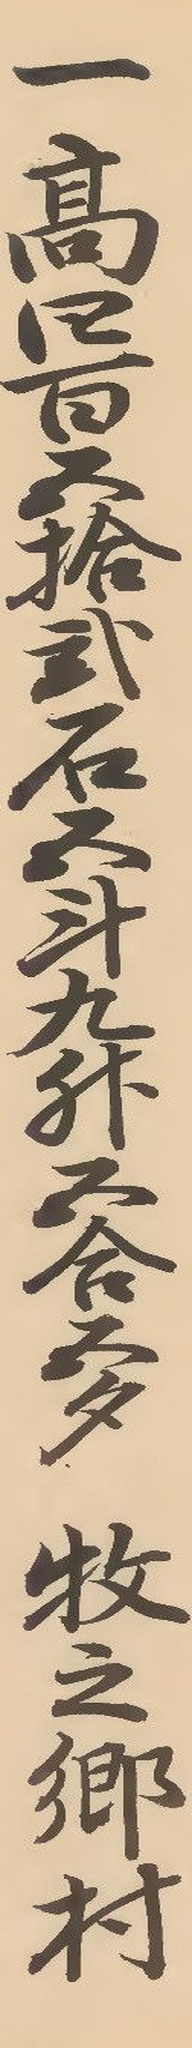一高四百五拾弐石五斗九升五合五勺牧之郷村
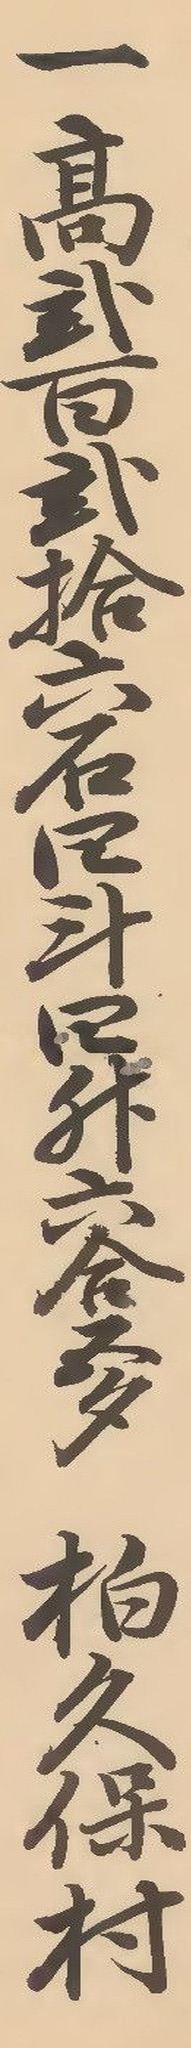一高弐百弐拾六石四斗四升六合五勺柏久保村

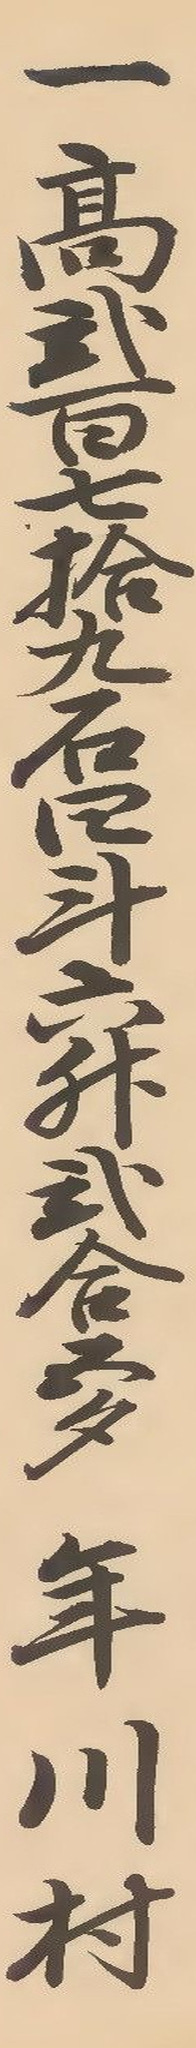一高弐百七拾九石四斗六升弐合五勺年川村
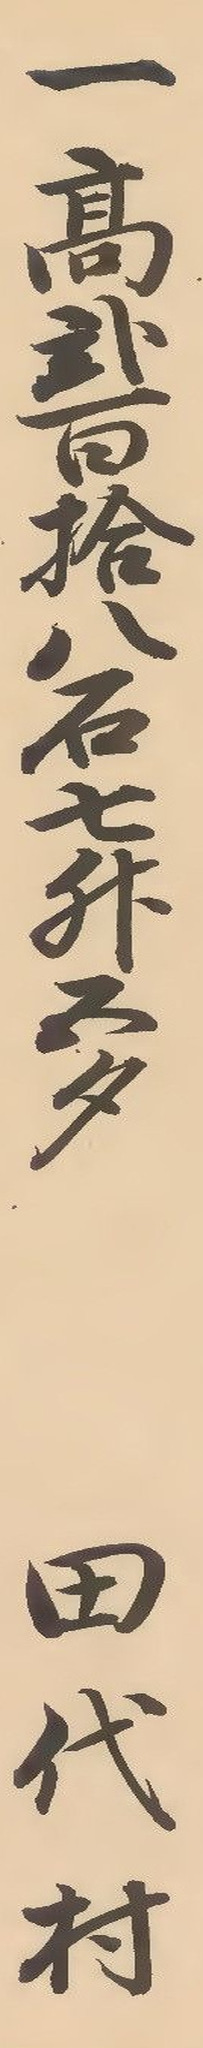一高弐百拾八石七升五勺田代村
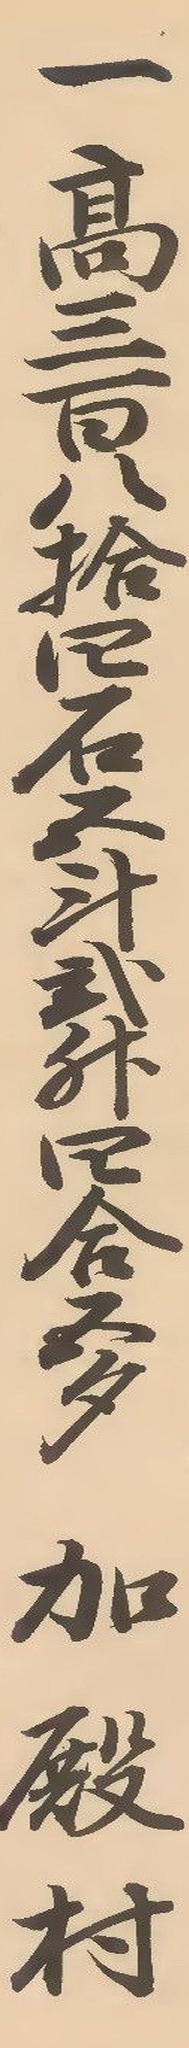一高三百八拾四石五斗弐升四合五勺加殿村
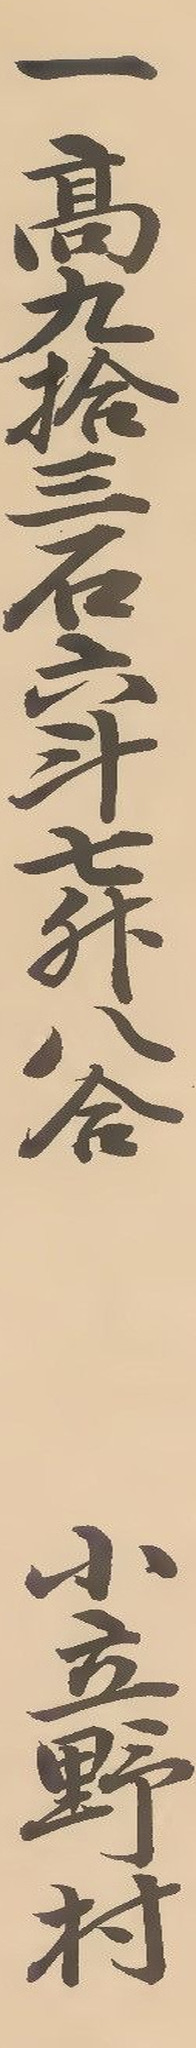一高九拾三石六斗七升八合小立野村
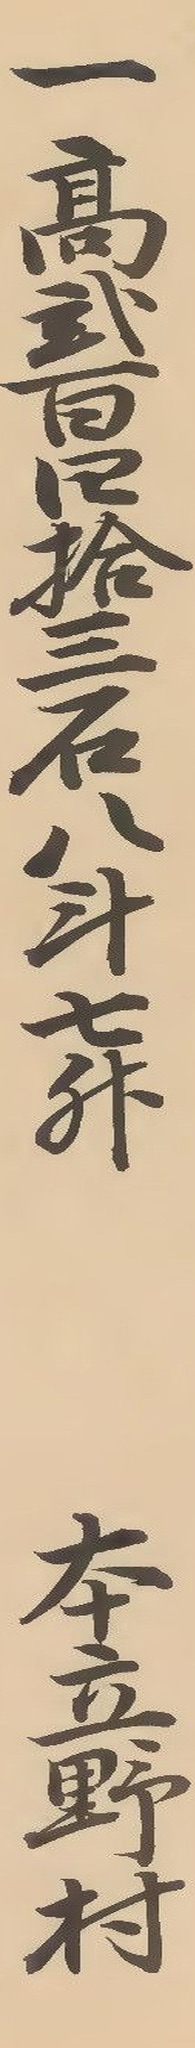一高弐百四拾三石八斗七升本立野村
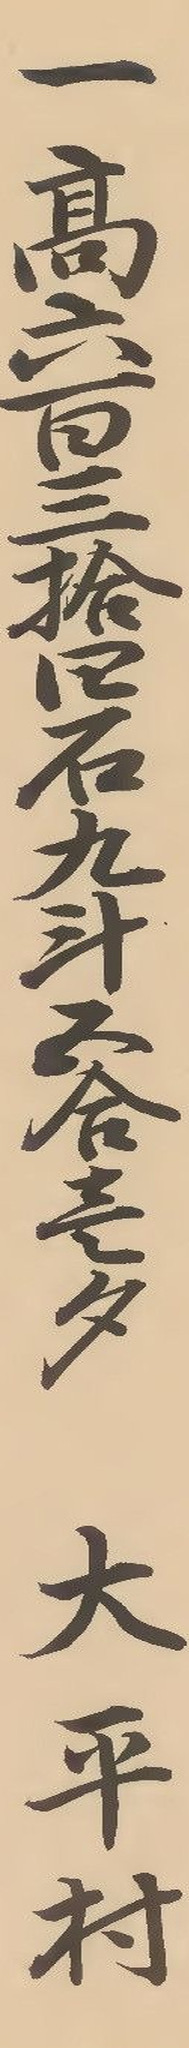一高六百三拾四石九斗五合壱勺大平村
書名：伊豆国郷帳
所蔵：国立公文書館 National Archives of Japan
